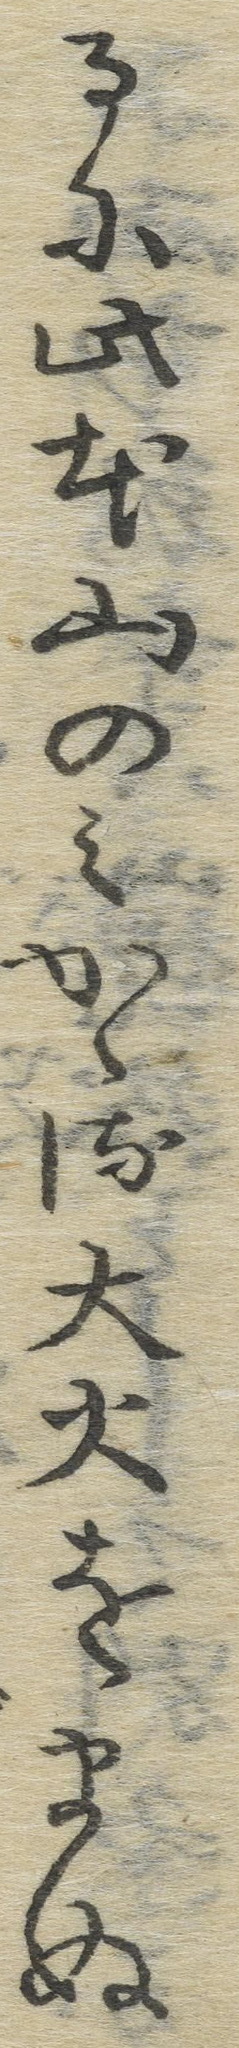るに此本山のみかゝる大火をまぬ
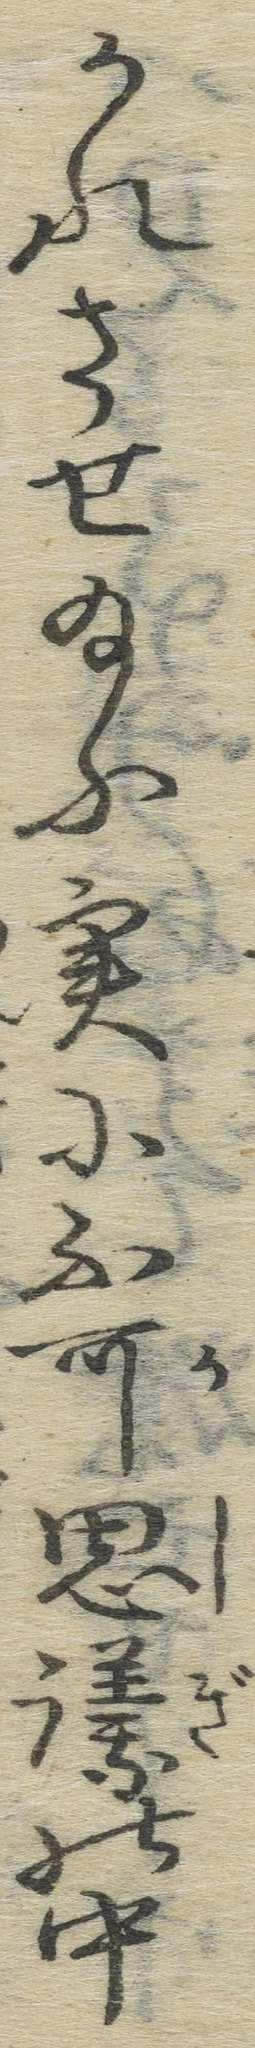かれさせ給ふ実に不可思議の中
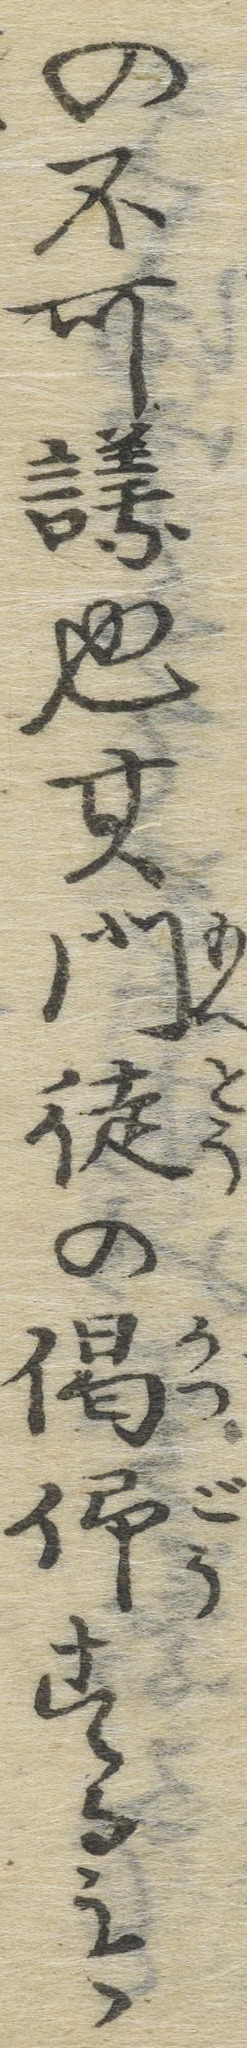の不可議也其門徒の偈仰するも
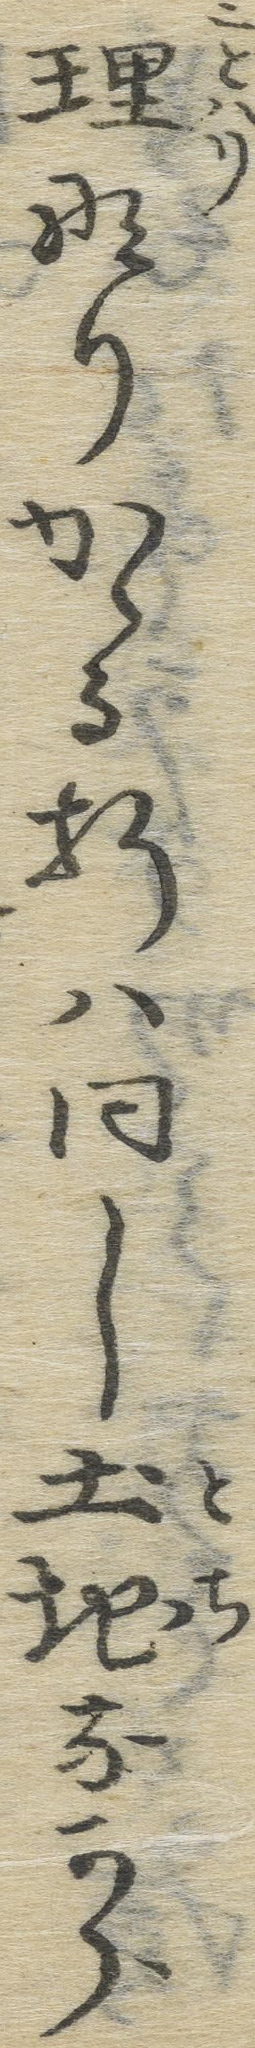理なりかゝる折は同し土地なから
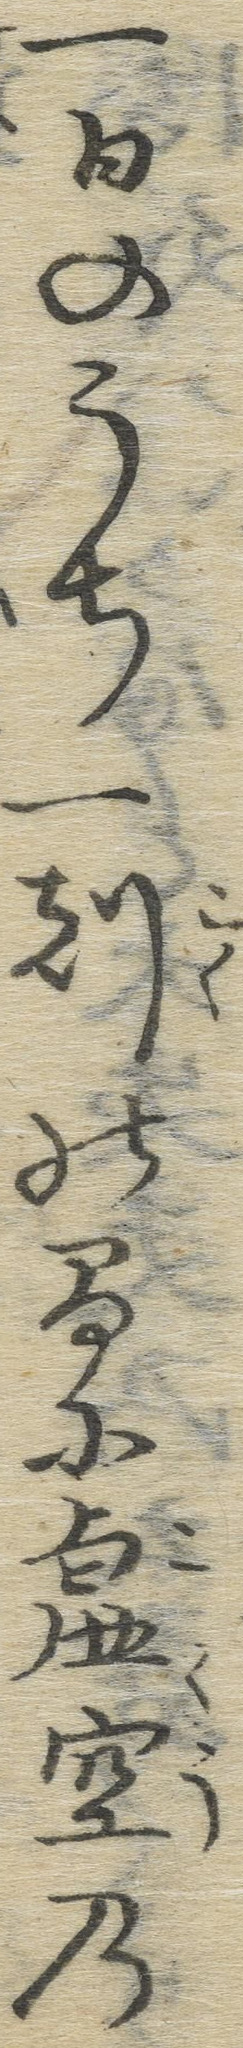一日のうち一刻の間に虚空の
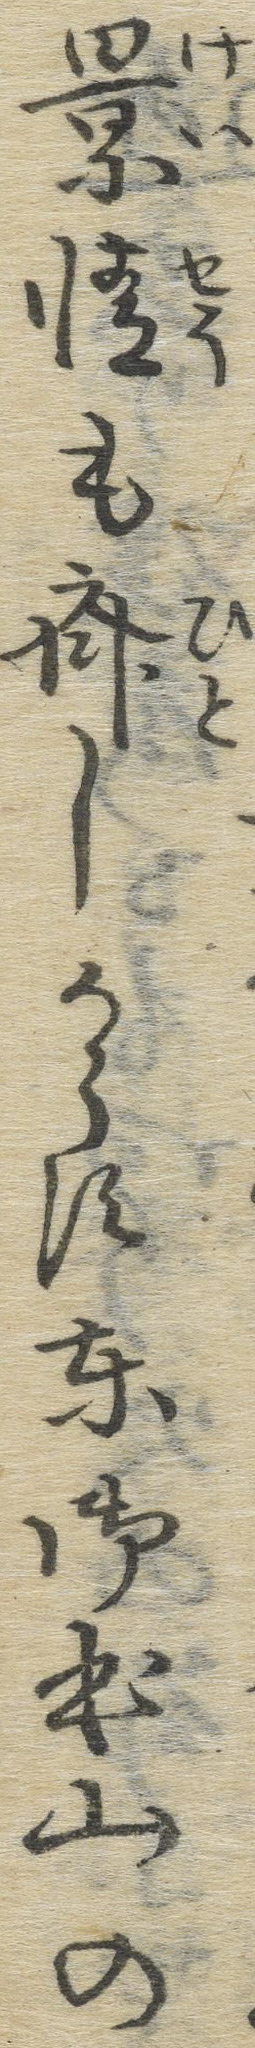景情も斉しからす東御本山の
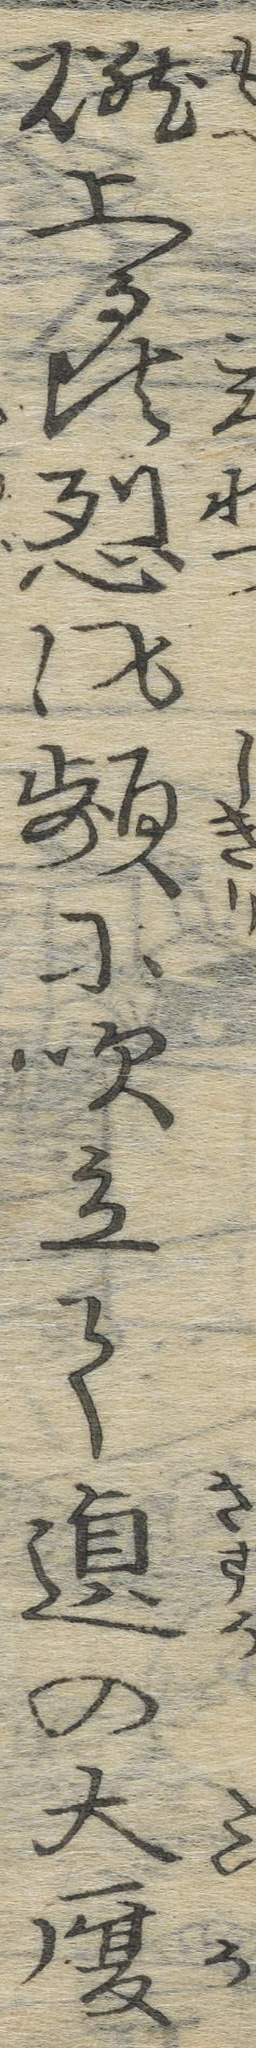燃上る此烈風頻に吹立て遉の大厦
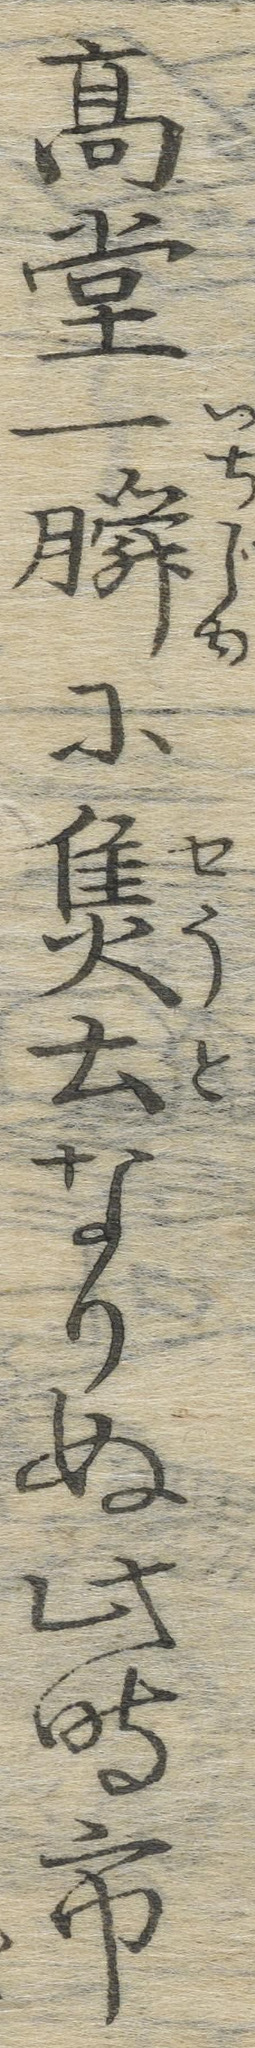髙堂一瞬に焦土なりぬ此時市
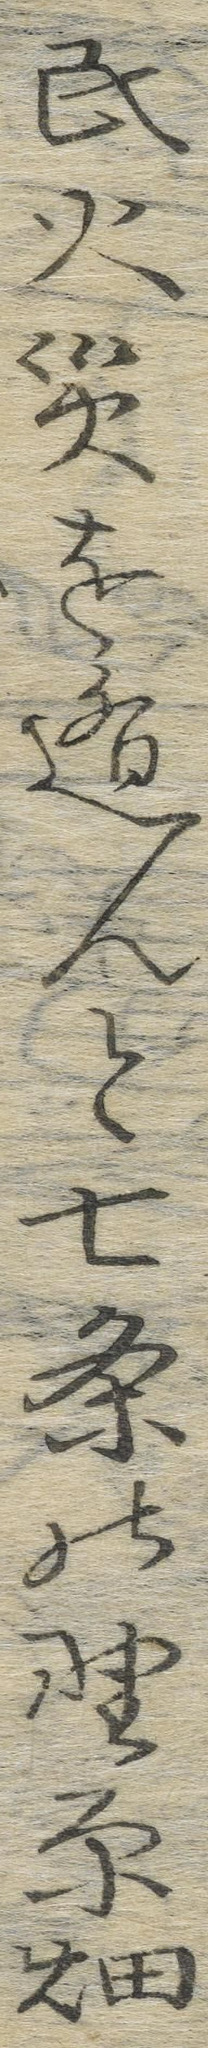民火災を遁んと七条の野原畑
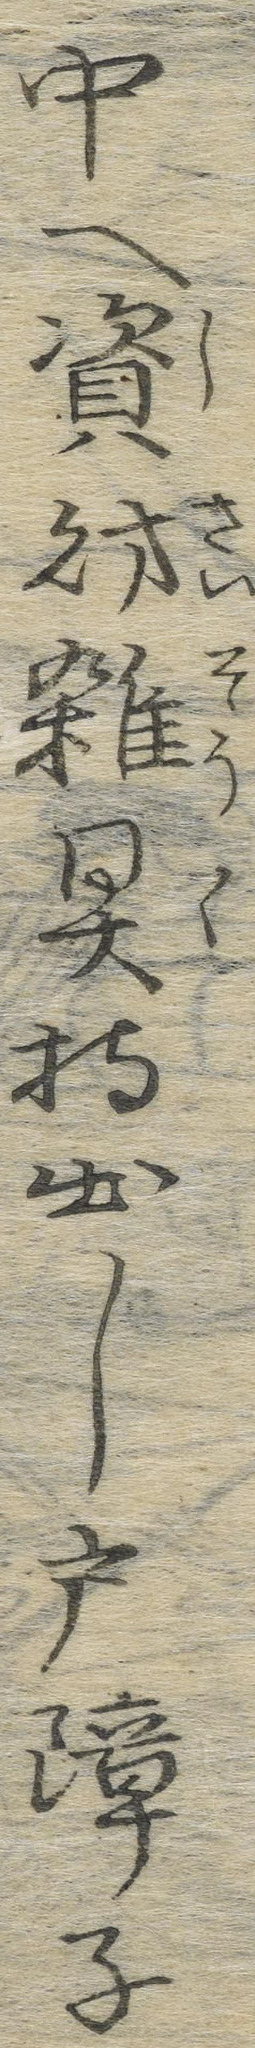中へ資材雑具持出し戸障子
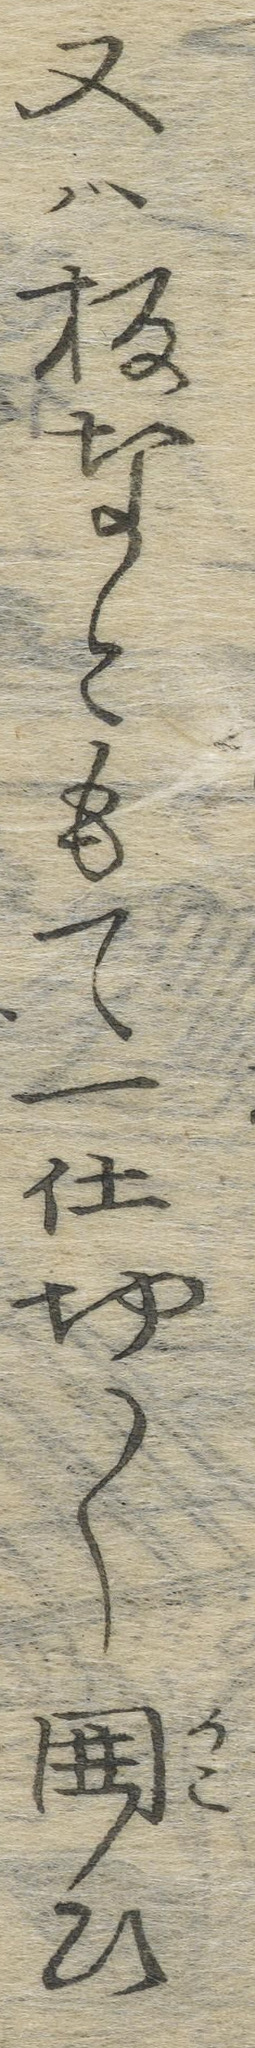又は板なともて一仕切〳〵囲ひ
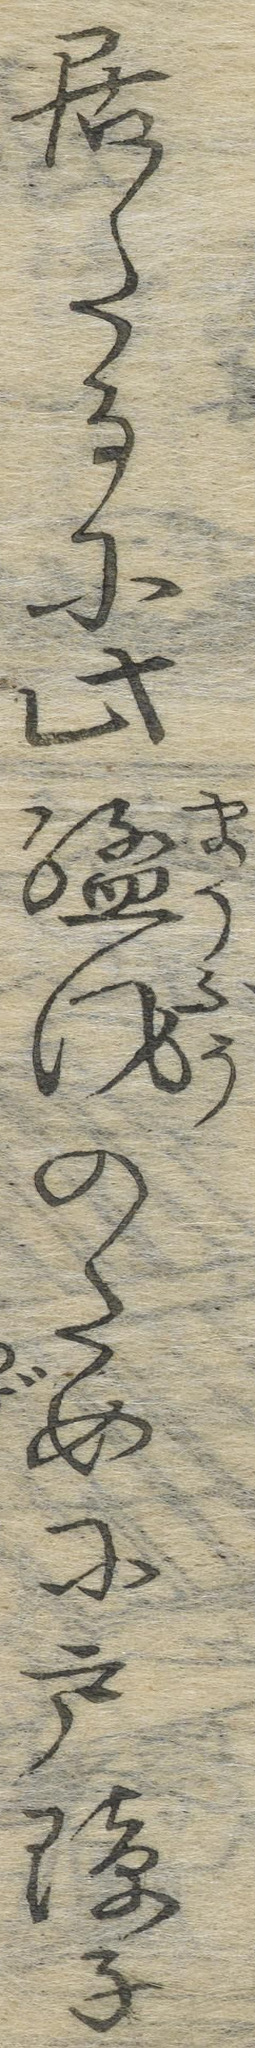居たるに此猛風のために戸障子
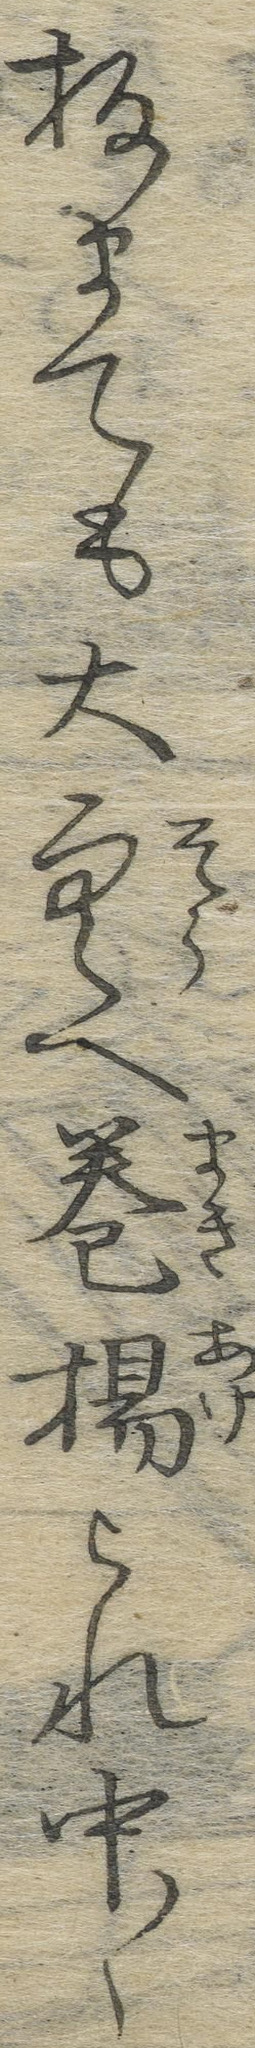板まても大空へ巻揚られ中〳〵
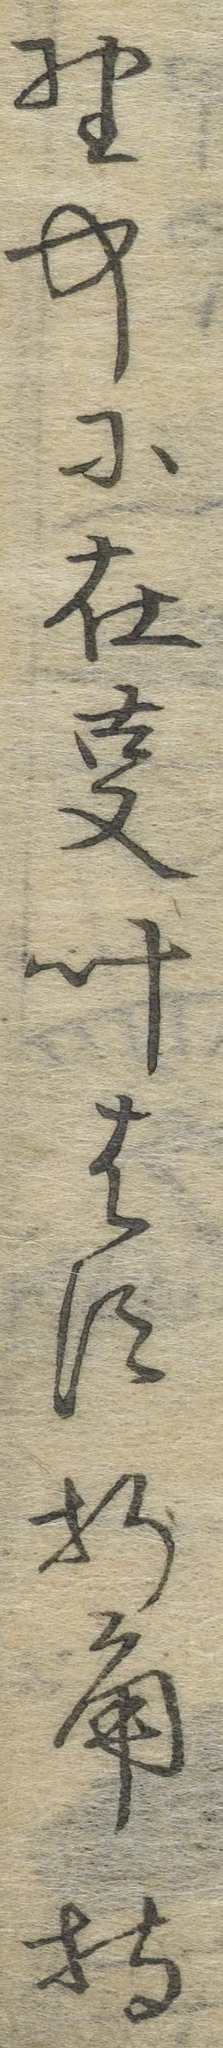野中に在事叶はす折角持

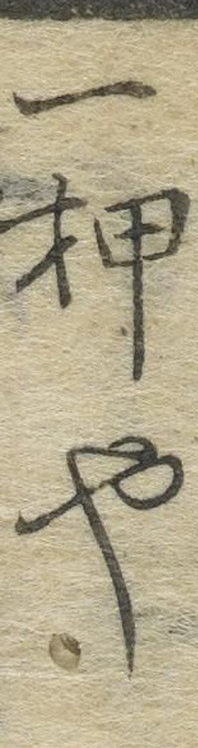一押や
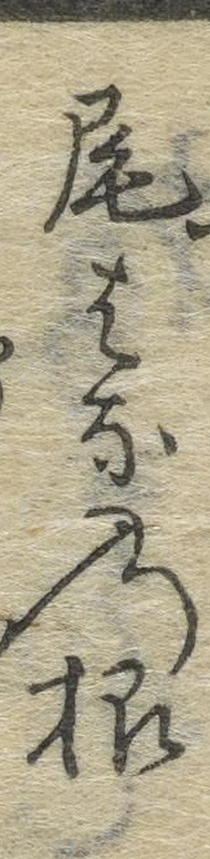尾はなの根
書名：あきの日照
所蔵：東京大学地震研究所図書室 Earthquake Research Institute Library, The University of Tokyo, JAPAN
